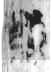無
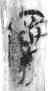○（藏）
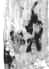貨
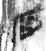西
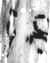流
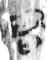君
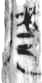濟
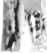於
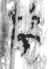東
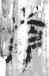南
